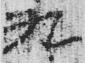九
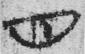四
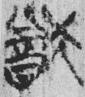猶
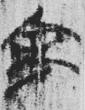○（豫）
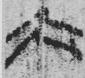大
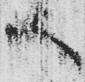又（有）
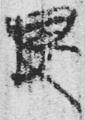○（得）
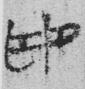母（毋）
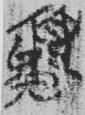○（疑）
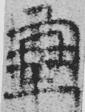○（朋）
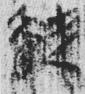欲（盍）
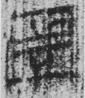○（簪）
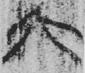六
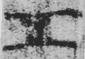五
